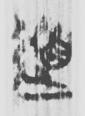道
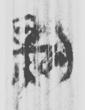則
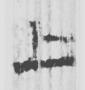上
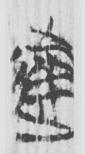{止達}
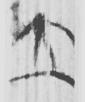立
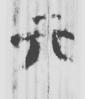亓
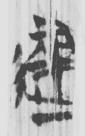{止達}
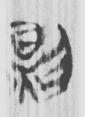則
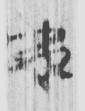弗
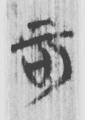可
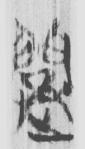{興止}
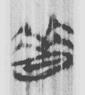昔
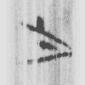之
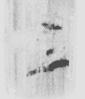十一
